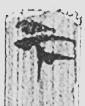下
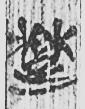楚
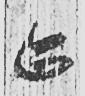𠂤
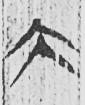大
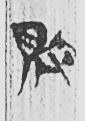敗
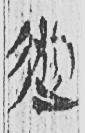{辶旅}
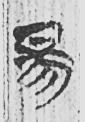昜
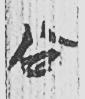公
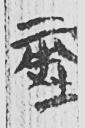坪
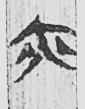亦
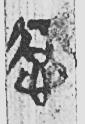{卲心}
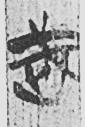武
